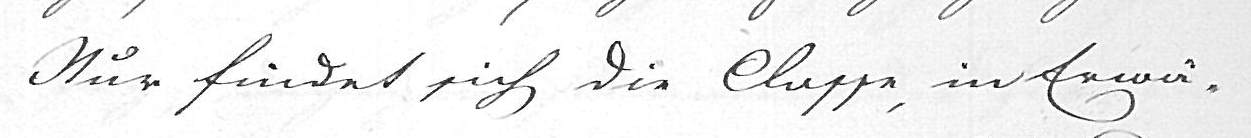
Nur findet sich die Classe in Erwä-
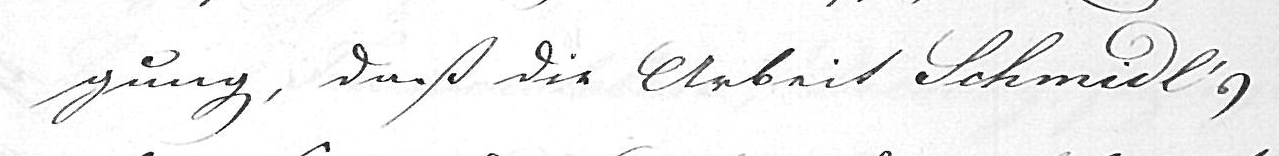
gung, daß die Arbeit Schmidl's
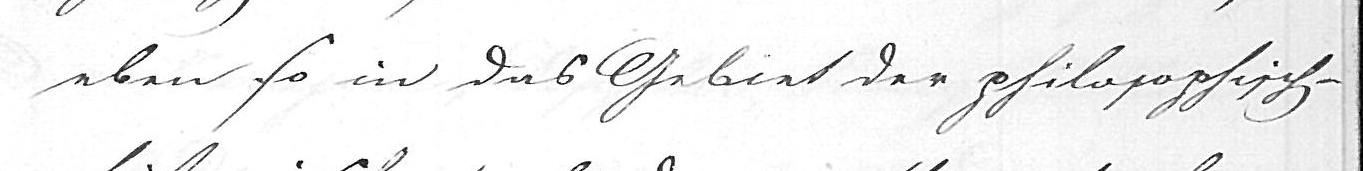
eben so in das Gebcet der philosophisch-
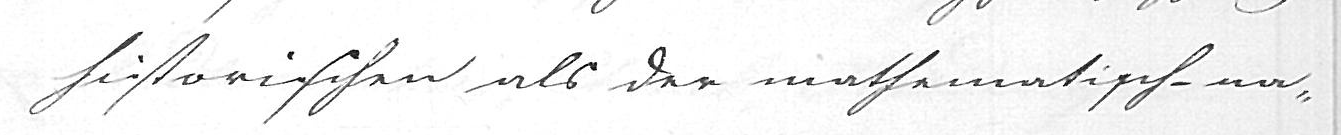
historischen als der mathematisch-na
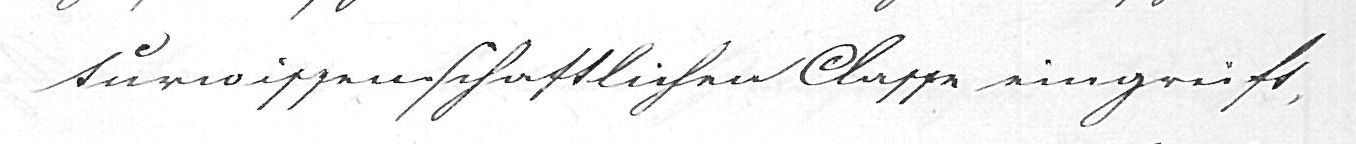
turwissenschaftlichen Classe eingreift,
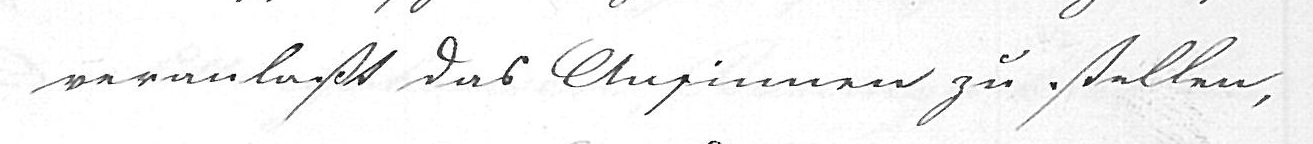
veranlaßt das Ansinnen zu stellen,
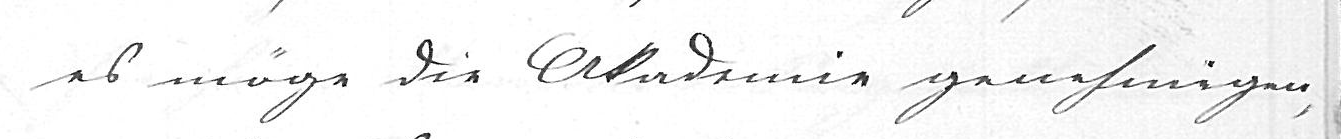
es möge die Akademie genehmigen,
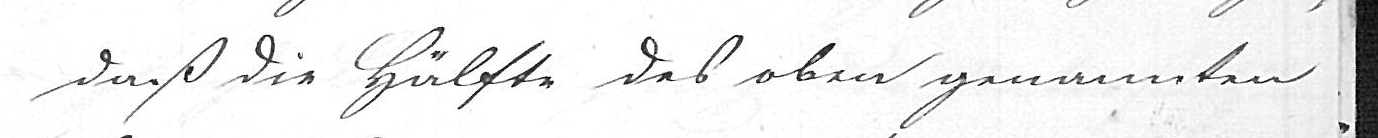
daß die Hälfte des oben genannten
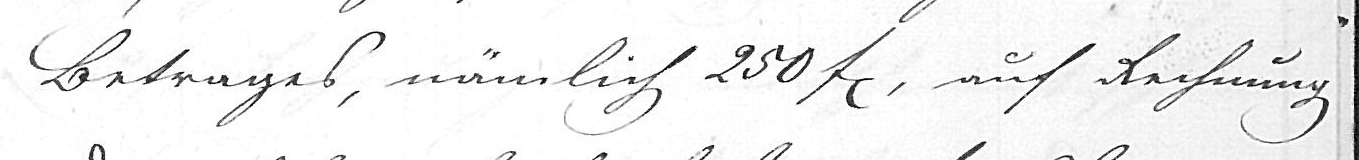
Betrages, nämlich 250 fl, auf Rechnung
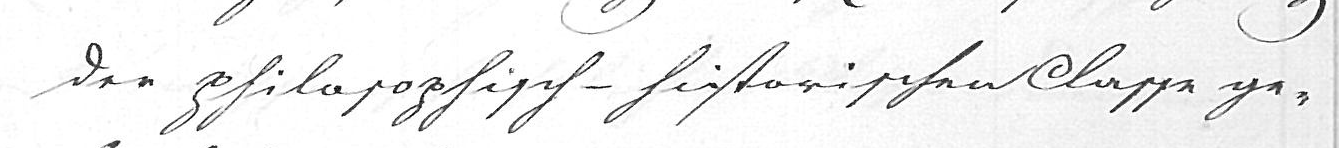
der philosophisch-historischen Classe ge-
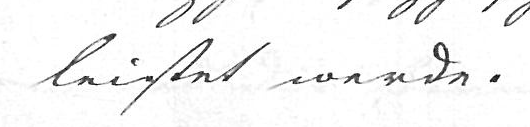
leistet werde.
